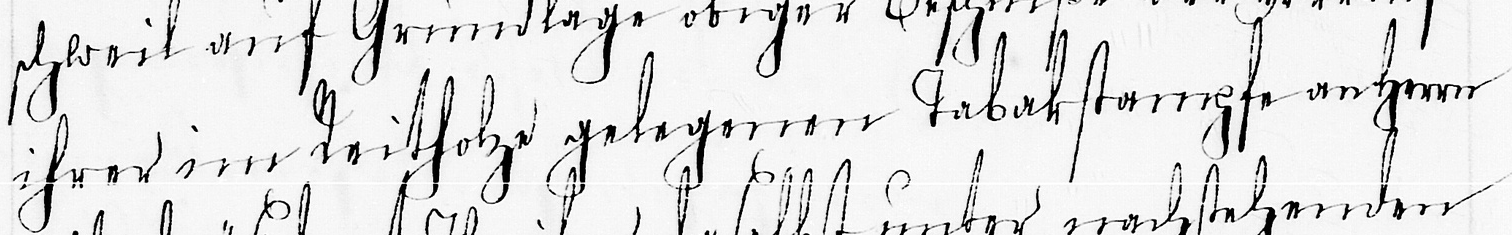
ihrer im Reitholze gelegenen Tabakstampfe an Herrn
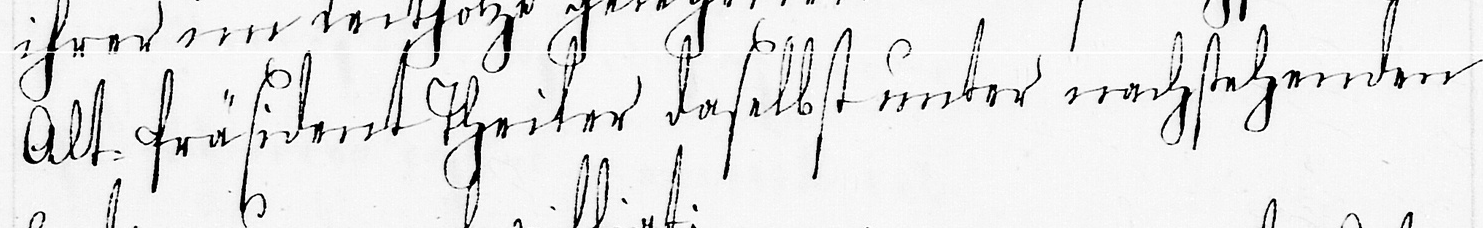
Alt-Präsident Theiler daselbst unter nachstehenden
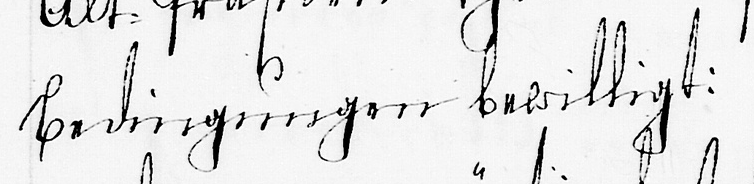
Bedingungen bewilligt:
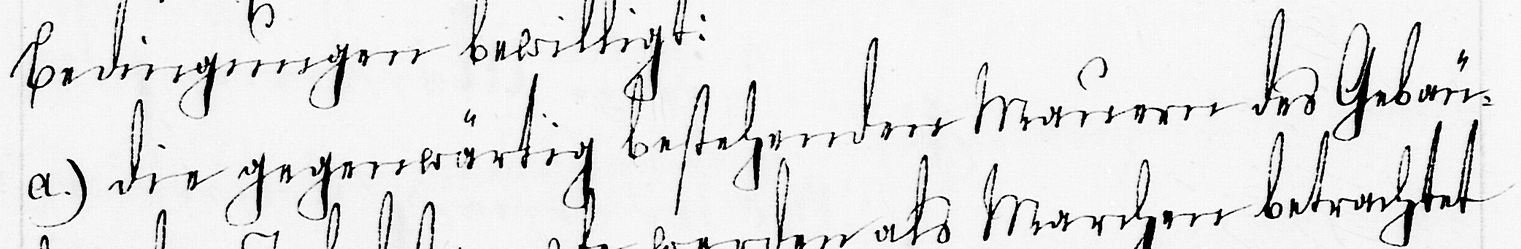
a.) die gegenwärtig bestehenden Mauern des Gebäu¬
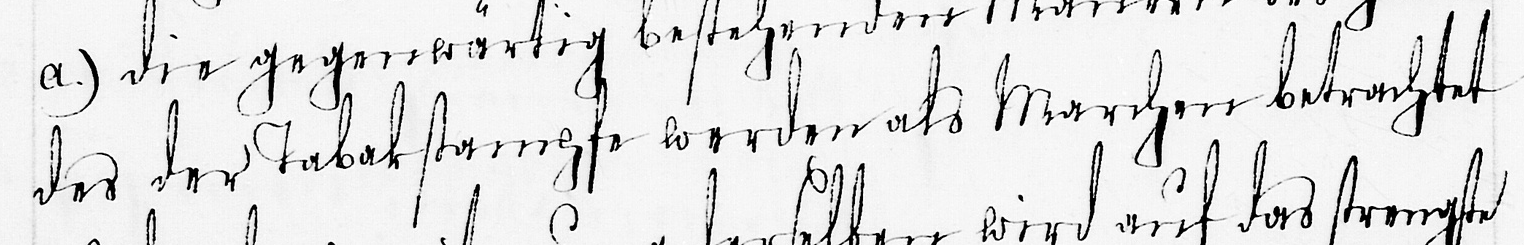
des der Tabakstampfe werden als Marchen betrachtet
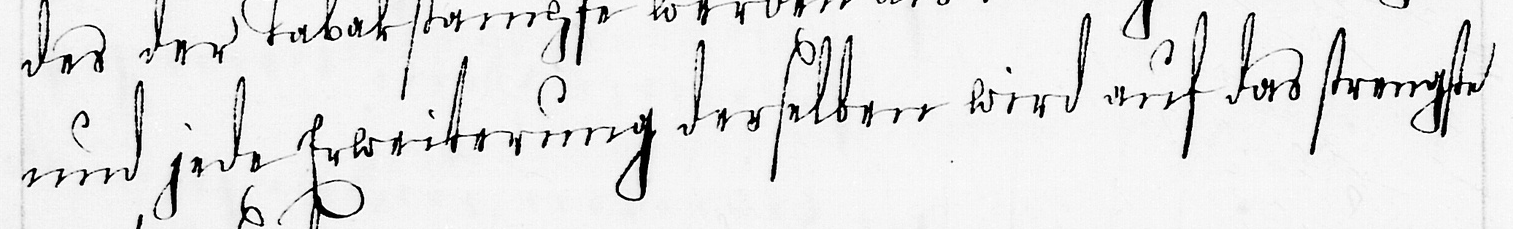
und jede Erweiterung derselben wird auf das strengste
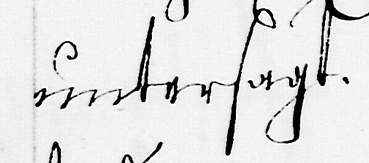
untersagt.
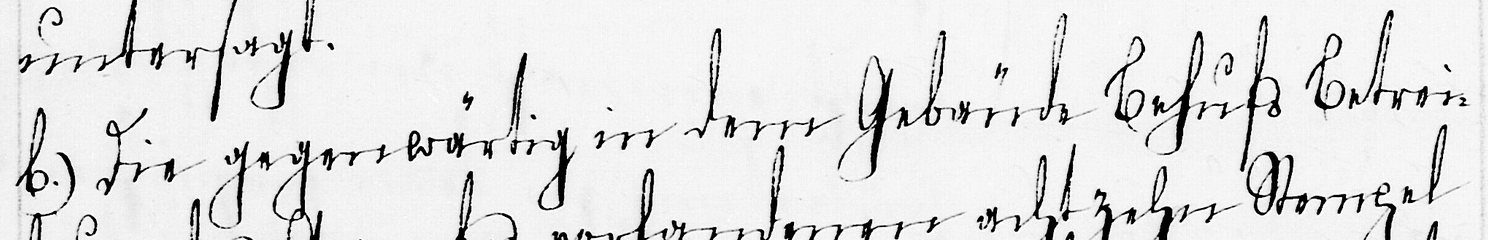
b.) Die gegenwärtig in dem Gebäude Behufs Betrei¬
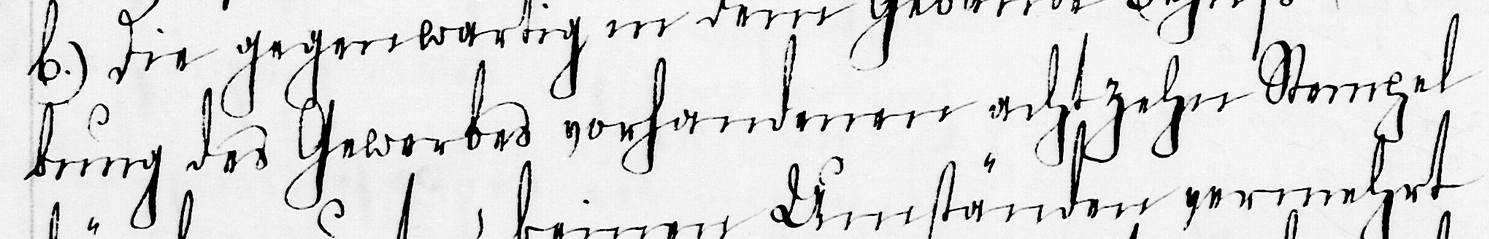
bung des Gewerbes vorhandenen achtzehn Stempel
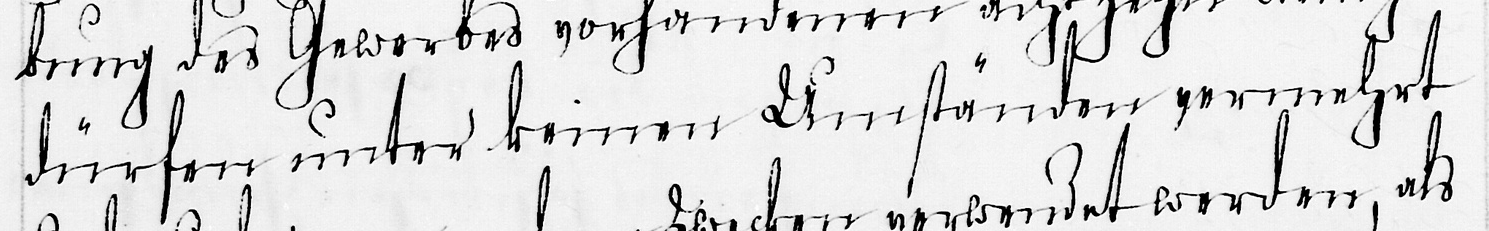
dürfen unter keinen Umständen vermehrt
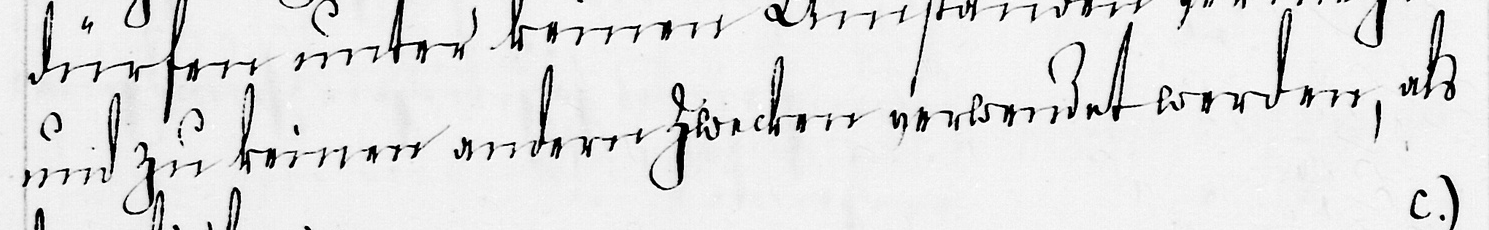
und zu keinen andern Zwecken verwendet werden, als
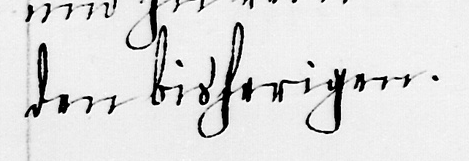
den bisherigen.
